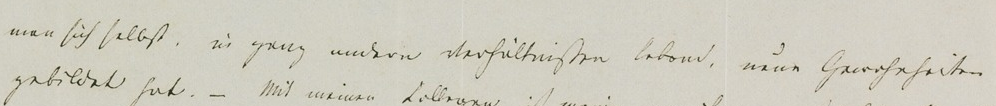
man sich selbst, in ganz andern Verhältnissen lebend, neue Gewohnheiten
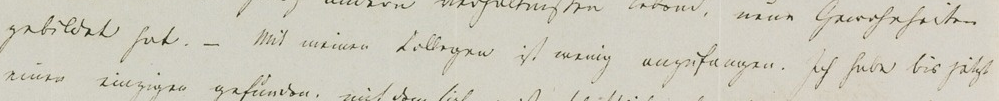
gebildet hat. – Mit meinen Collegen ist wenig anzufangen. Ich habe bis jetzt
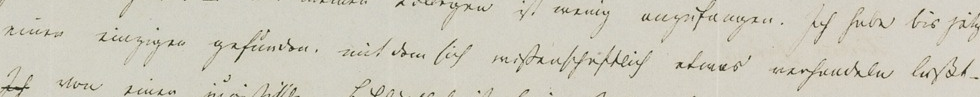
einen einzigen gefunden, mit dem sich wissenschaftlich etwas verhandeln läßt.
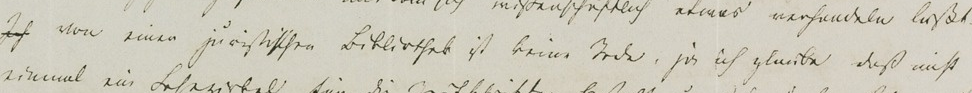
Ich Von einer juristischen Bibliothek ist keine Rede, ja ich glaube, daß nicht
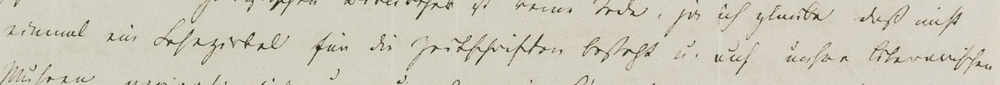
einmal ein Lesezirkel für die Zeitschriften besteht u. auf unsre literarischen
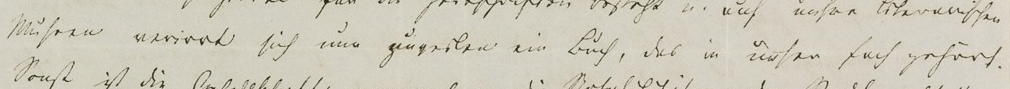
Museen verirrt sich nur zuweilen ein Buch, das in unser Fach gehört.
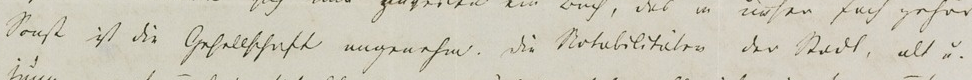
Sonst ist die Gesellschaft angenehm. Die Notabilitäten der Stadt, alt u.
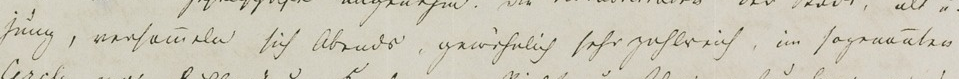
jung, versammeln sich Abends, gewöhnlich sehr zahlreich, im sogenannten
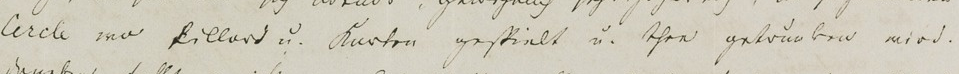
Cercle wo Billard u. Karten gespielt u. Thee getrunken wird.
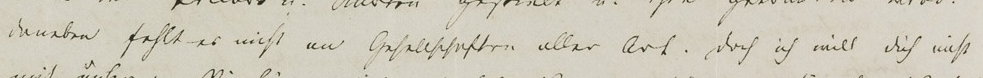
Daneben fehlt es nicht an Gesellschaften aller Art. Doch ich will dich nicht
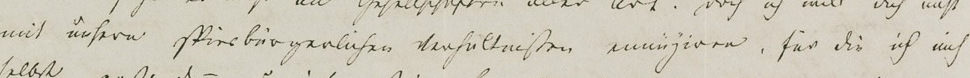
mit unsern spiesbürgerlichen Verhältnissen ennuyiren, für die ich mich
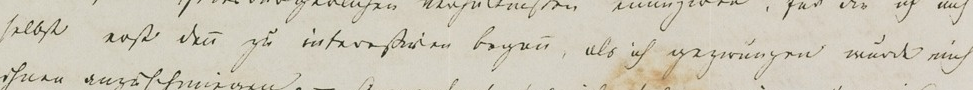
selbst erst dann zu interessiren begann, als ich gezwungen wurde mich
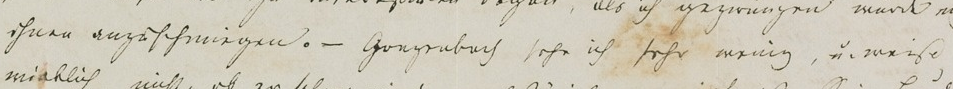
ihnen anzuschmiegen. – Gonzenbach sehe ich sehr wenig, u. weiß
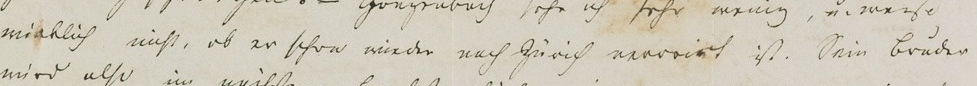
wirklich nicht, ob er schon wieder nach Zürich verreist ist. Sein Bruder
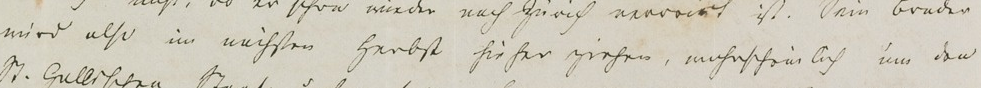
wird also im nächsten Herbst hieher ziehen, wahrscheinlich um den
